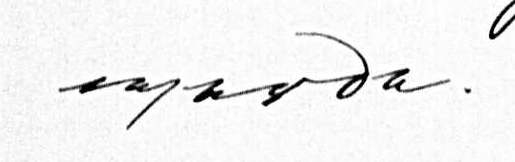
werde.
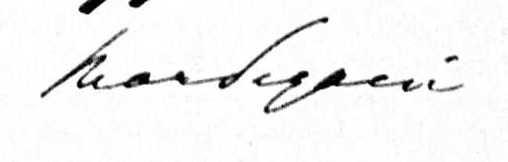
Mardegani
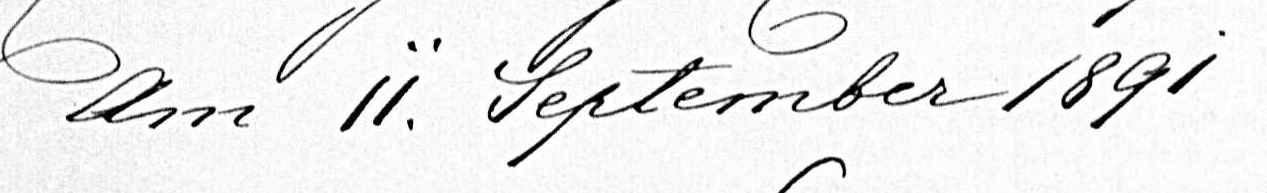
Am 11. September 1891
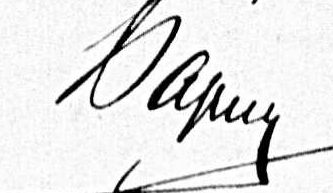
Papay
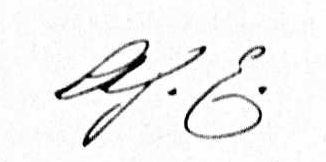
Ah. E.
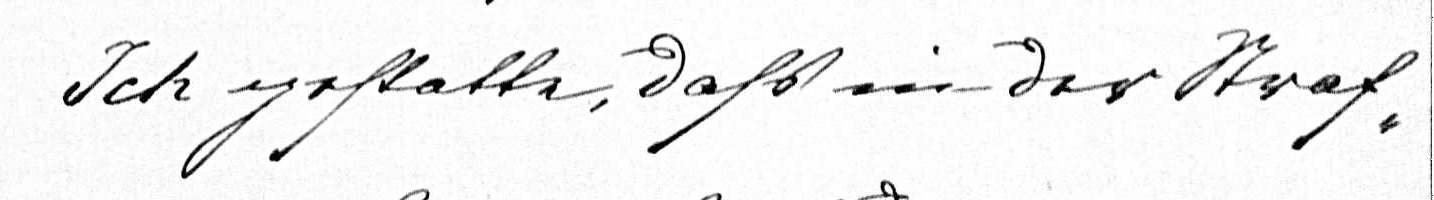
Ich gestatte, daß in der Straf¬
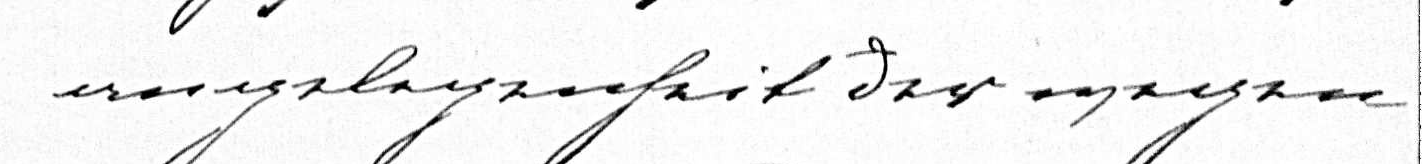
angelegenheit der wegen
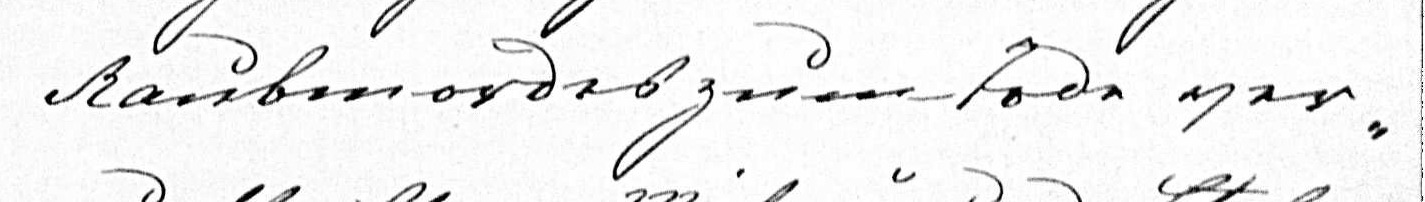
Raubmordes zum Tode ver¬
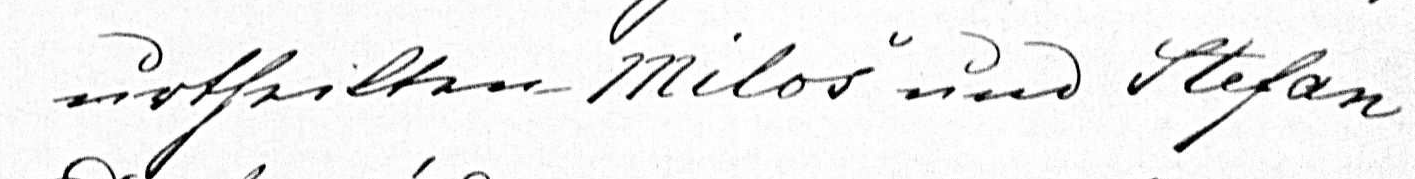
urtheilten Miloš u. Stefan
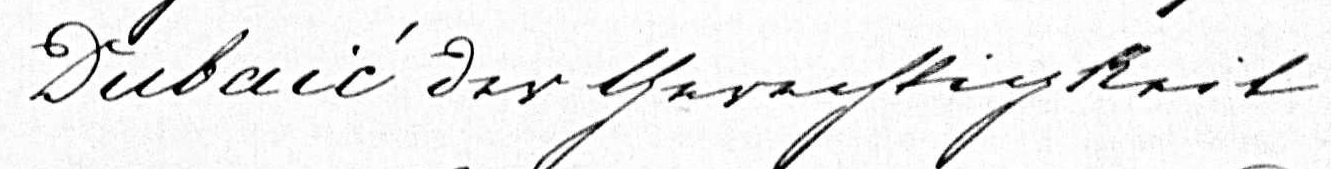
Dubaić der Gerechtigkeit
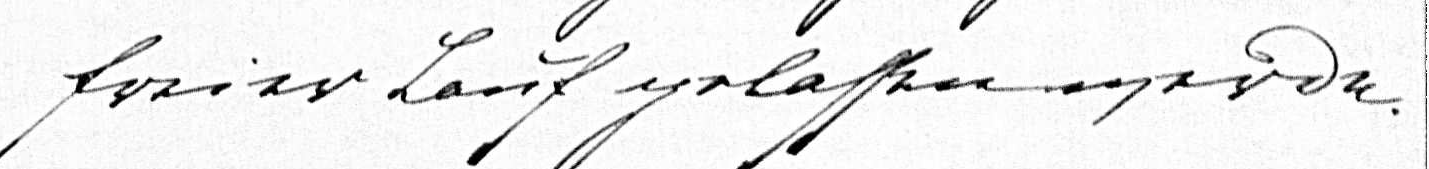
freier Lauf gelassen werde.
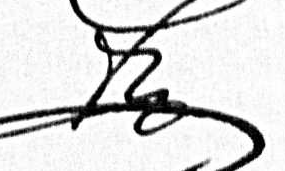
FJ
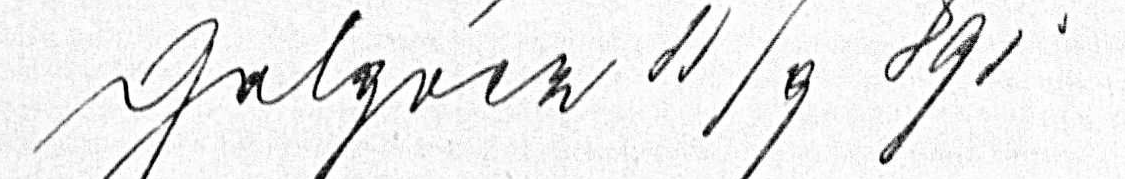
Galgócz 11/9 1891
